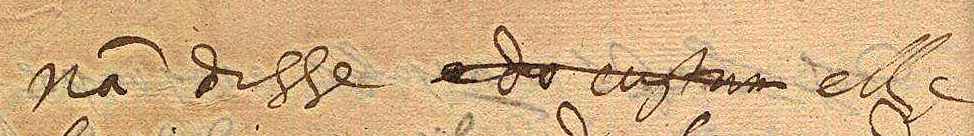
nā disse e do custum e lhe
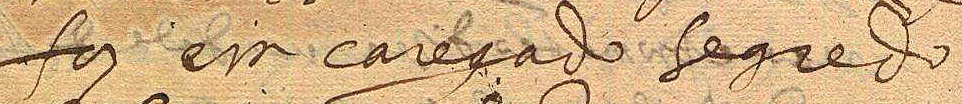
foj emcaregado segredo
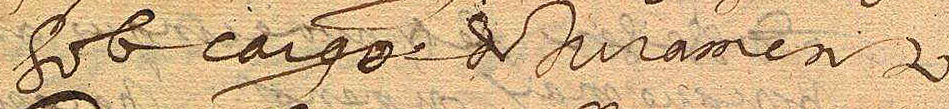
sob cargo do Juramento
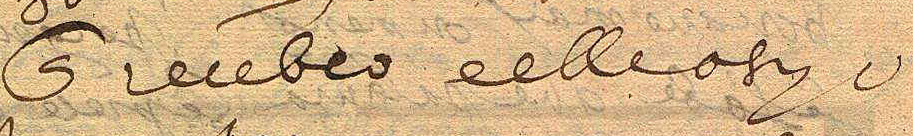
q̄ recebeo e elle asy o
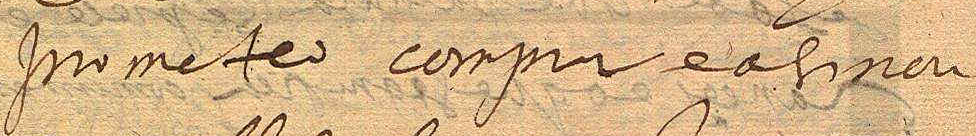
prometeo comprir e asinou
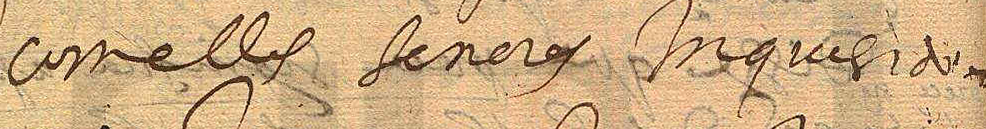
com elles senores Inquesido
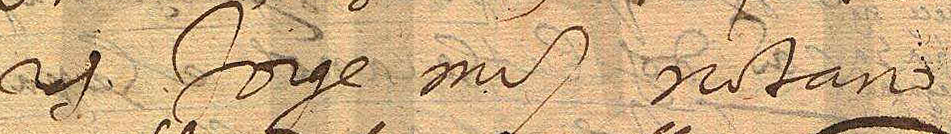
res Jorge mīz notario
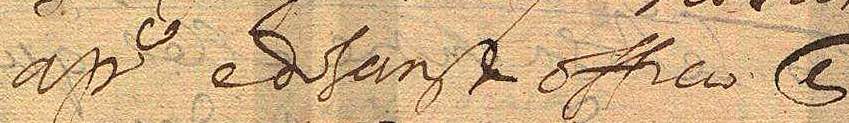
apco e do sancto officio q̄
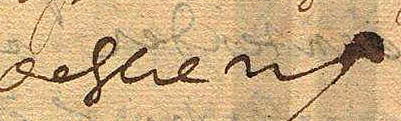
o escreuj
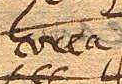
corea
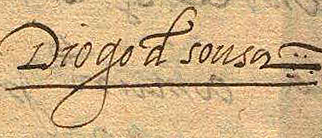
Diogo d̄ sousa
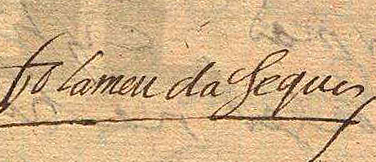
b̄olameu daosequa
